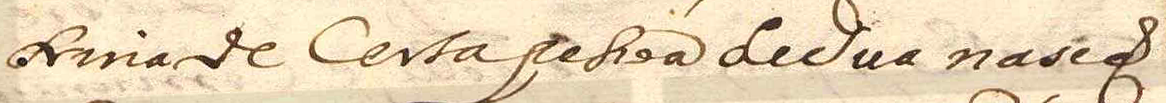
trina de Certa pessoa de sua nasçaõ
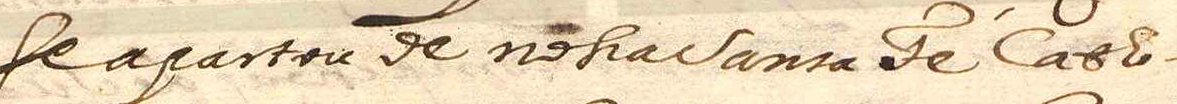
se apartou de nossa santa Fé Catho
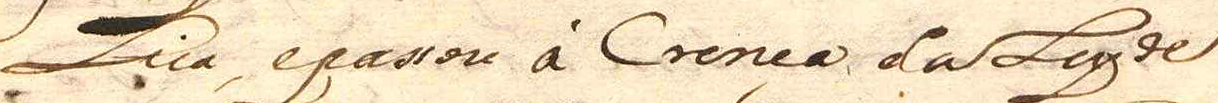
Lica, e passou á Crença da Ley de
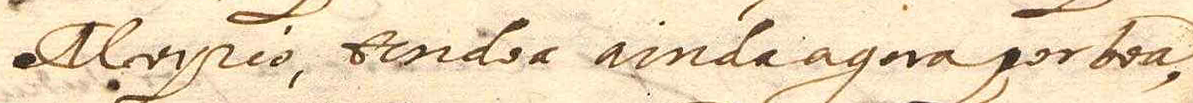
Moyzés, tendoa ainda agora por boa,
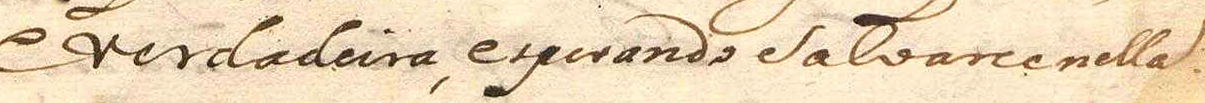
e verdadeira, esperando salvarce nella.
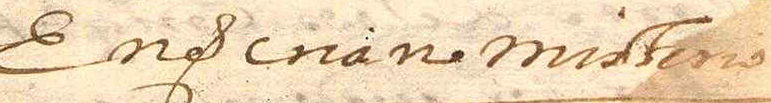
E naõ cria no misterio
